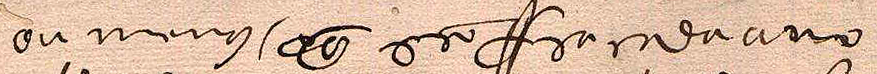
ou menꝯ / e q̄ se c̄offesa cada ano
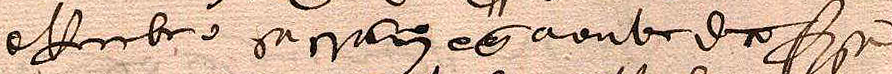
e Recebe o sacramto e q̄ a ouve de c̄ofjsā
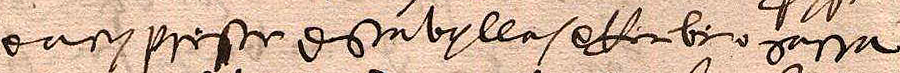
o acypreste desta vylla / e Recebe o sacra
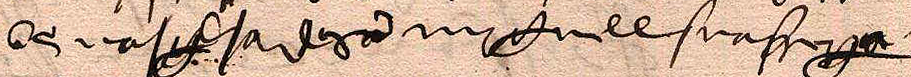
mto na JḡJa de sā mjguell sua frega
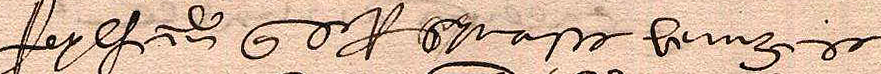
foylhe mdo q̄ se ꝑsynasse bemzese
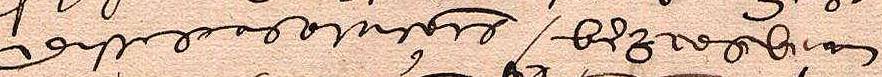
e dissese as orações / bēzeose bem
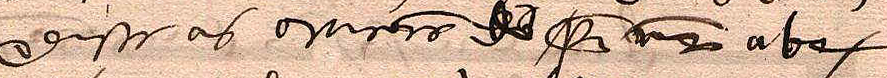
e disse as orações do p̄r n̄ro ave /
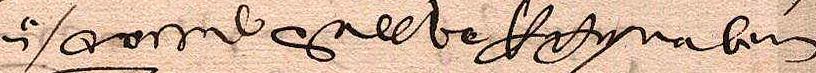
ma / e o credo e sallve Regyna bem
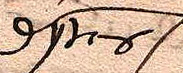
dytas /
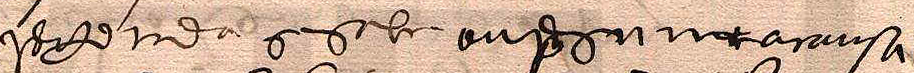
p̄gūtada se sabe ou p̄sume a causa
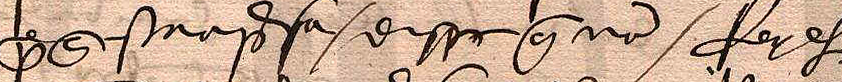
p̄o q̄ estaa p̄sa / disse q̄ nā / foylhe
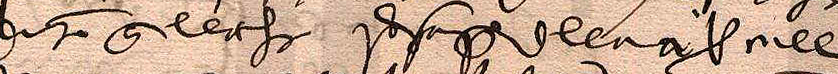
dito q̄ ella he p̄sa p̄o della aꝟ cull
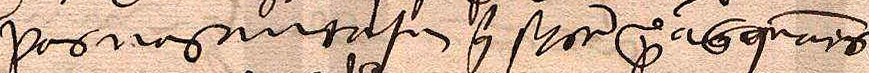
pas na santa jmqisysā p̄o as qūaes
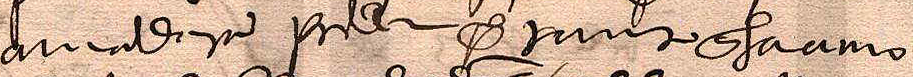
a mādarā prēder p̄otanto q̄ ha amo
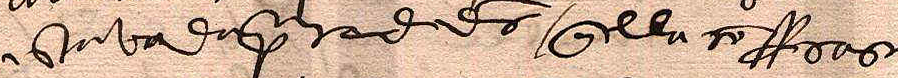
estava da p̄te de ds̄ / q̄ ella cōffesase
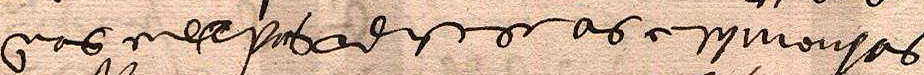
suas cullpas e disese as cerymonjas
